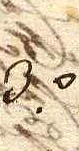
3.o
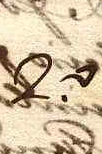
2.o
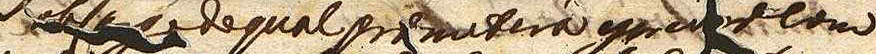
sob Ca_go do qual prometerá escrev_r com
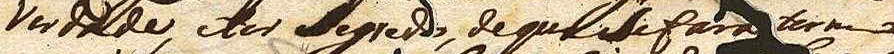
verdade, e ter Segredo, de que Se fara termo
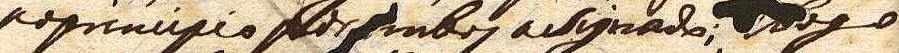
ao principio por _mbos asignado; Logo
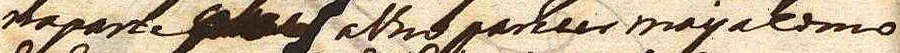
na parte que a Vm parecer mais acomo
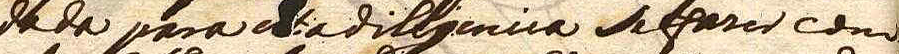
dada para e_ta diligencia se fazer com
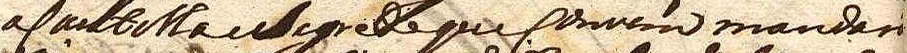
a Cautella e Segredo que Convem mandar
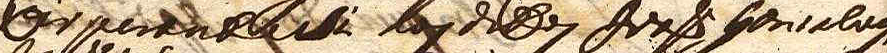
vir perante Si aos ditos Joaõ Gonsalves,
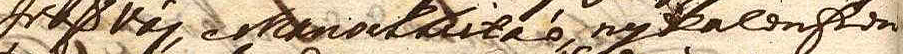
Joaõ Vás, e Manoel Leitaõ, nesta Confron
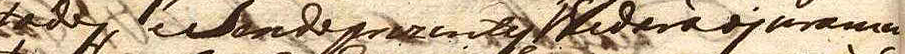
tados, e Sendo prezentes lhe dará o juramen
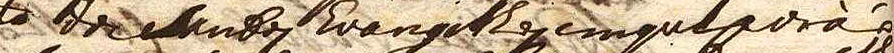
to dos Santos Evangelhos com que porá a
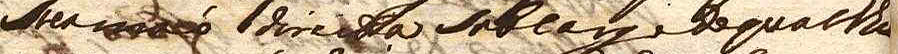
sua maõ direita sob cargo do qual lhe
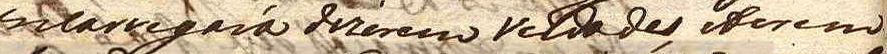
encarregará dizerem verdade, e terem
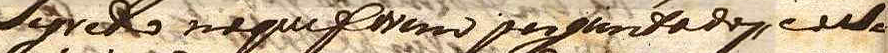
Segredo no que forem perguntados, e o Se
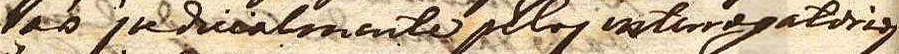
aõ judicialmente pelos interrogatorios
